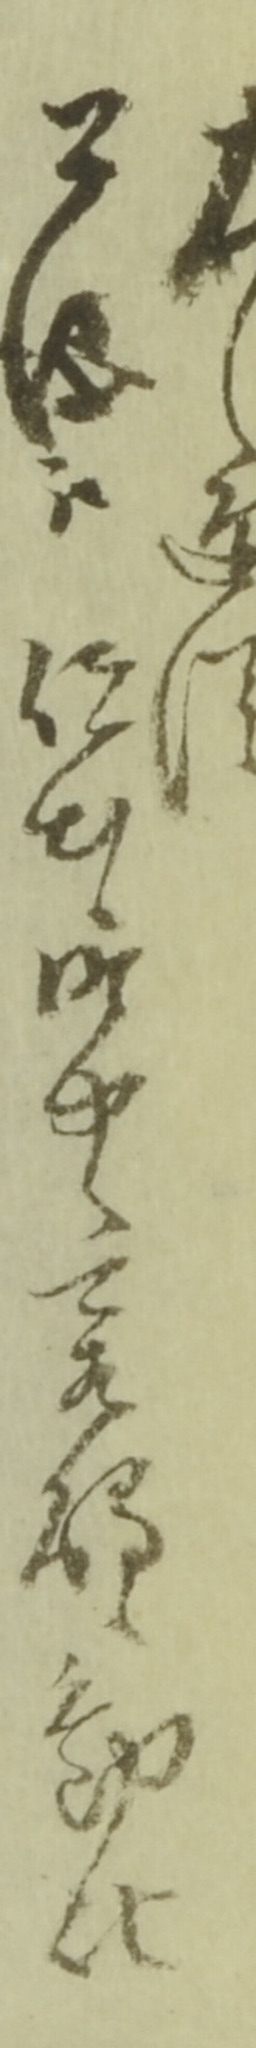公儀被仰出候町中へ可相触候勧化
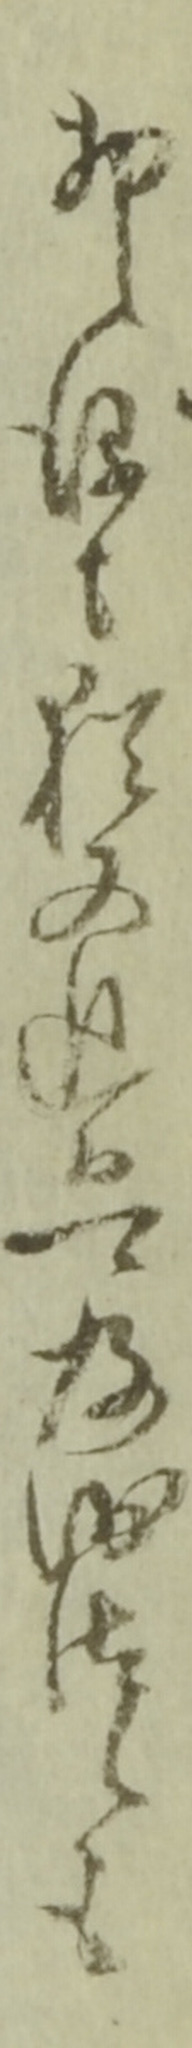物之儀者猶又追而可及沙汰候以上

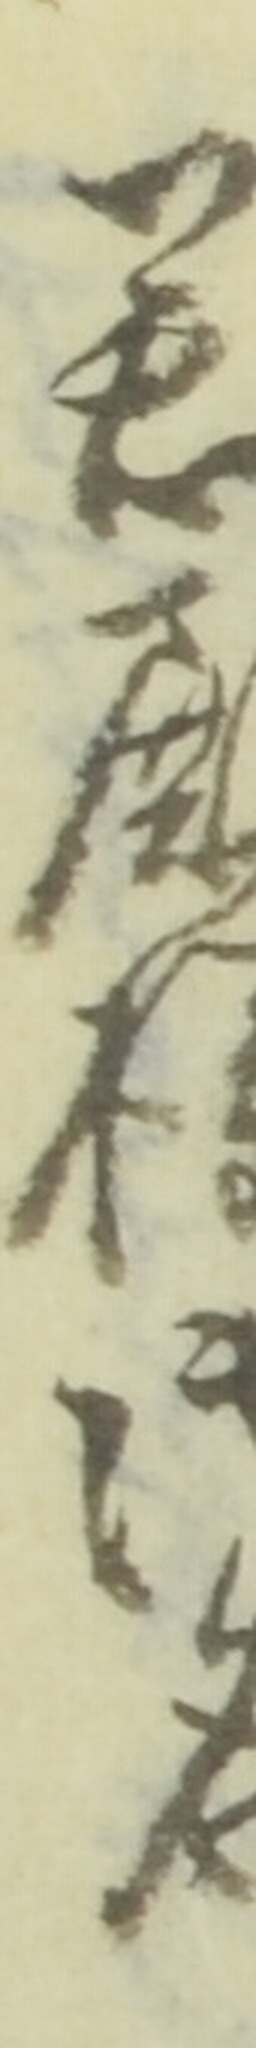若君様御名
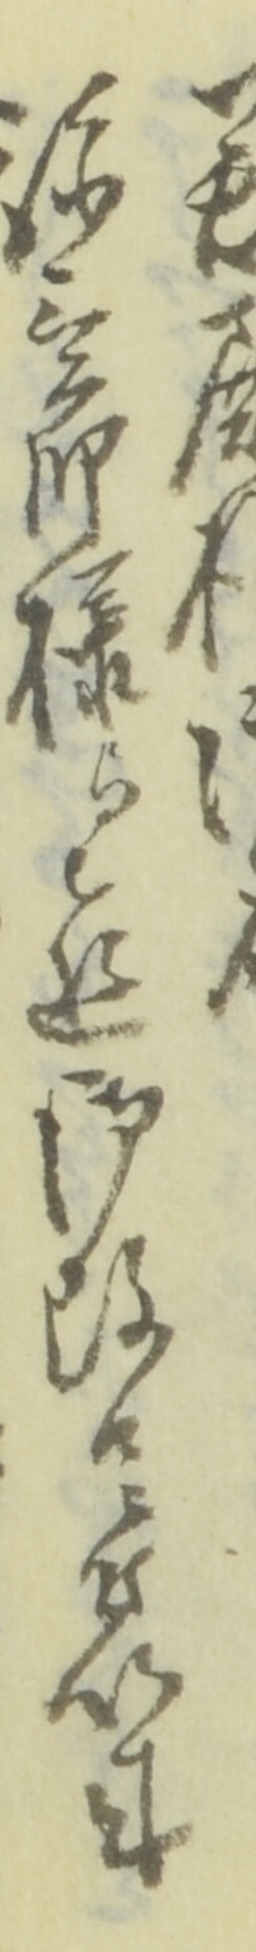丹後守様より被遊御改候二付以来
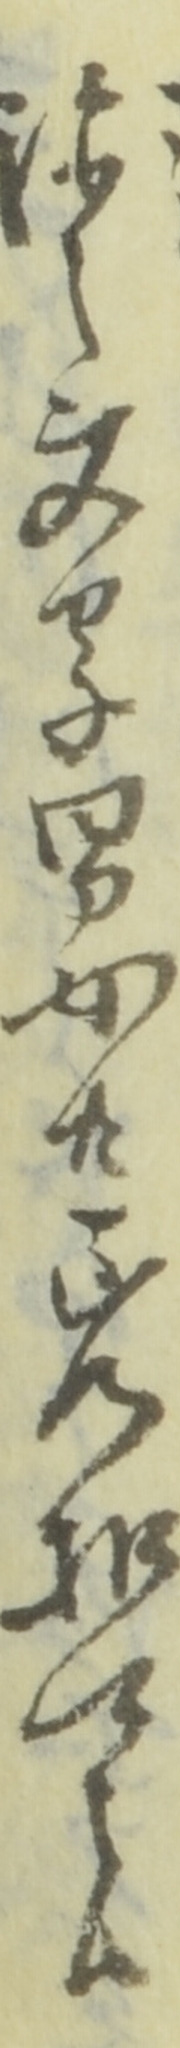丹之文字男女共差控可申候尤
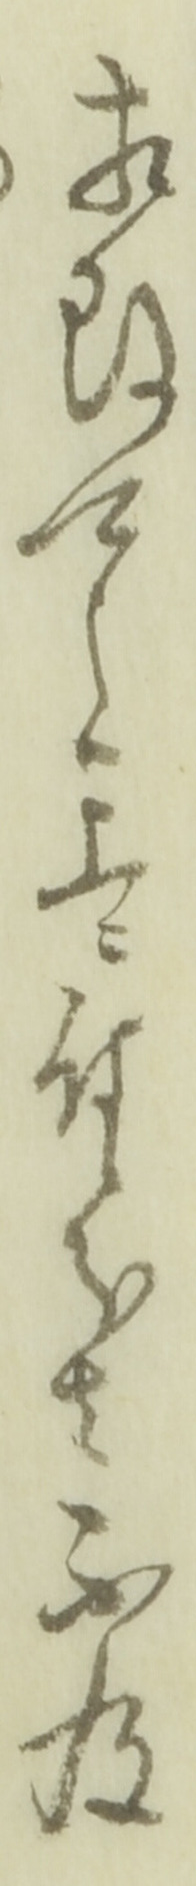相改可申候上二付分者不及
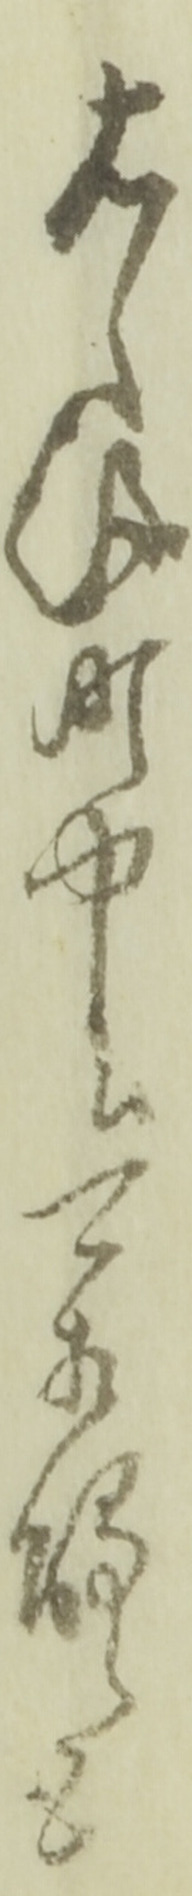右之趣町中え可相触候以上
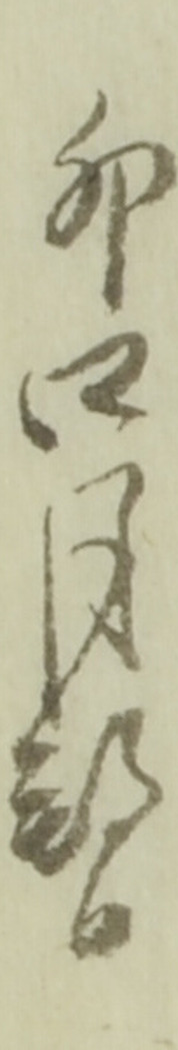卯四月朔日
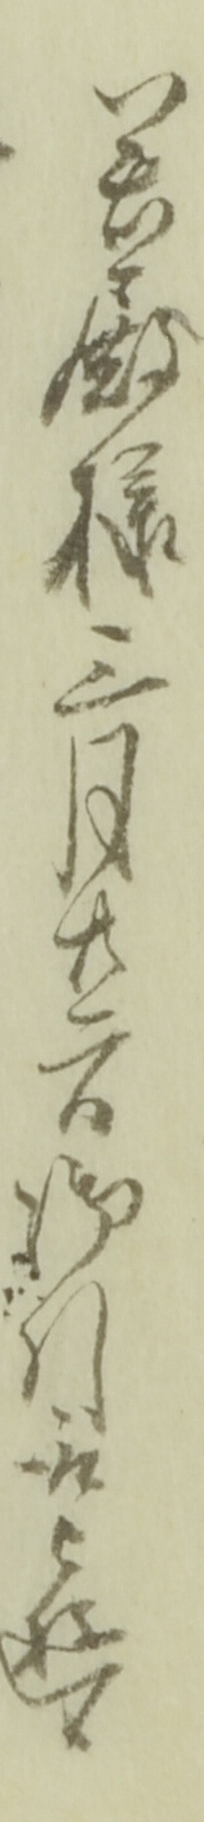若殿様三月廿二日御引取被遊候
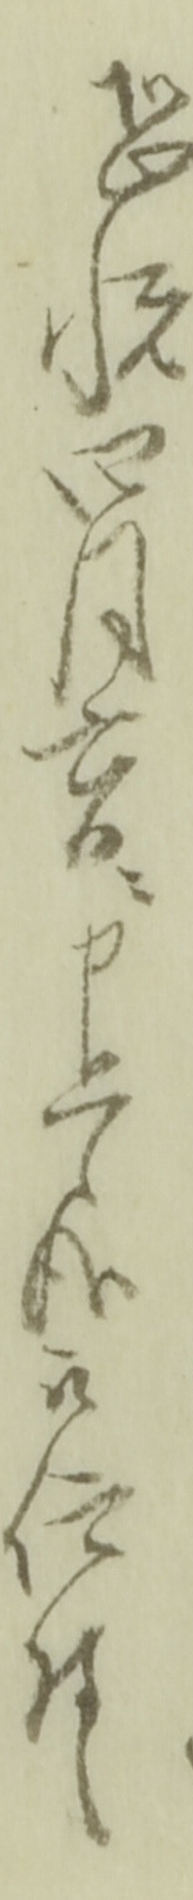恐悦四月六日二申上候儀被仰付候
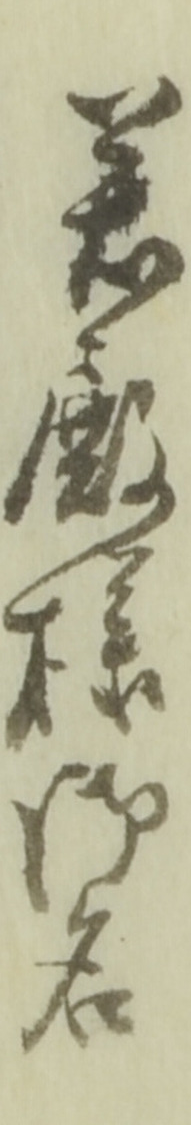若君様御名
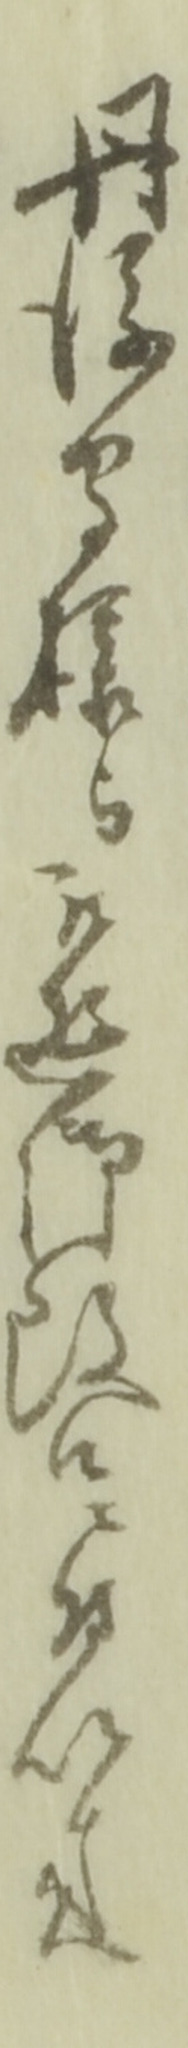丹後守様より被遊御改候二付以来
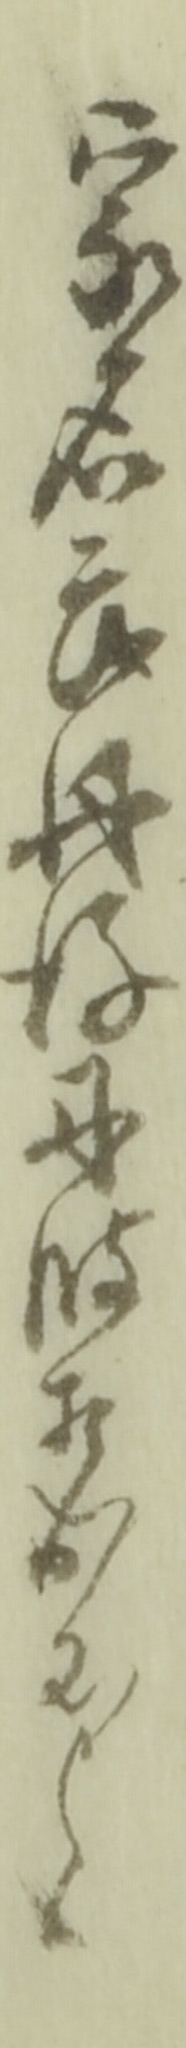家名茂丹後丹波相成不申候
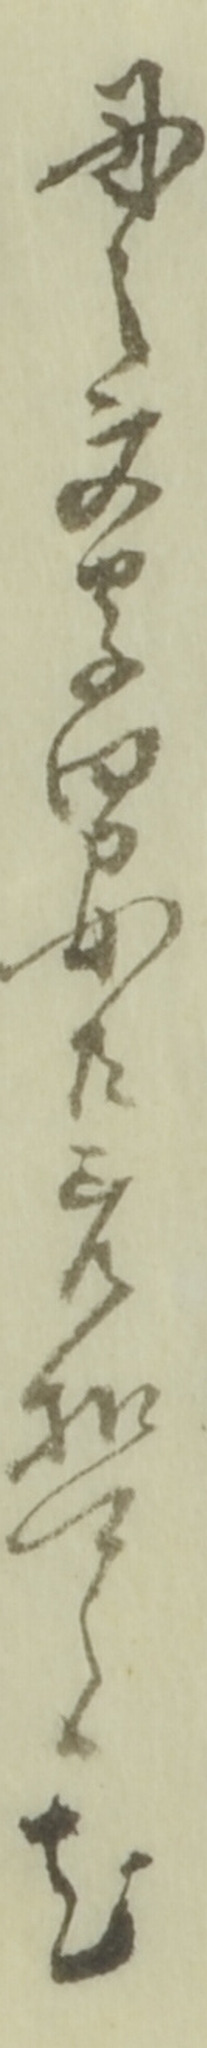丹之文字男女共差控可申候尤
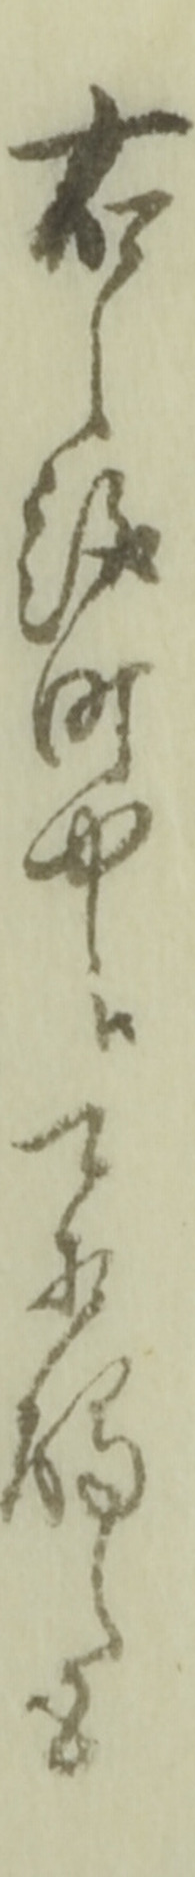右之趣町中え可相触候以上
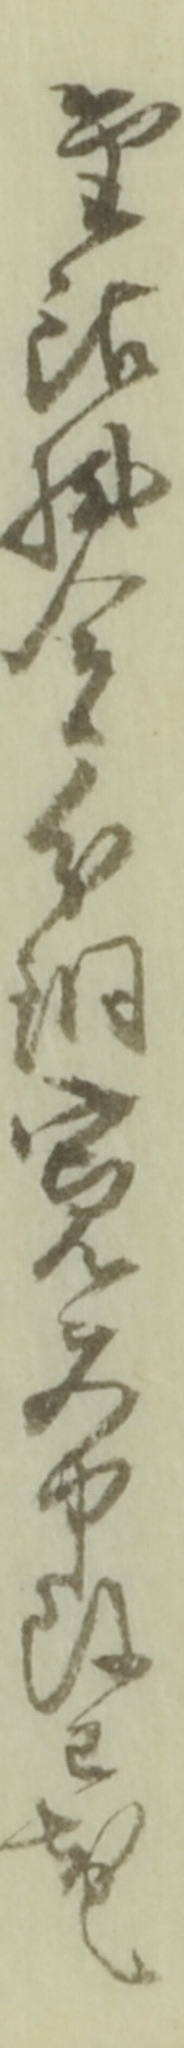金銀掛合候分銅寛文中改己者候
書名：御公儀様御領主様御触書控
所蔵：伊那市立高遠町図書館・合同会社AMANE
